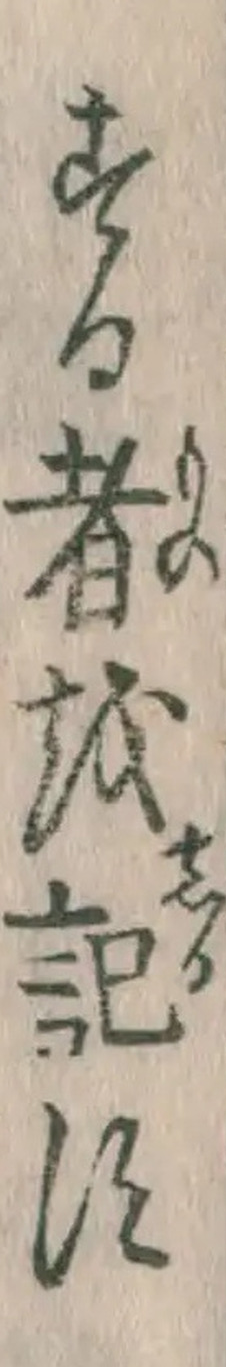する者を記す
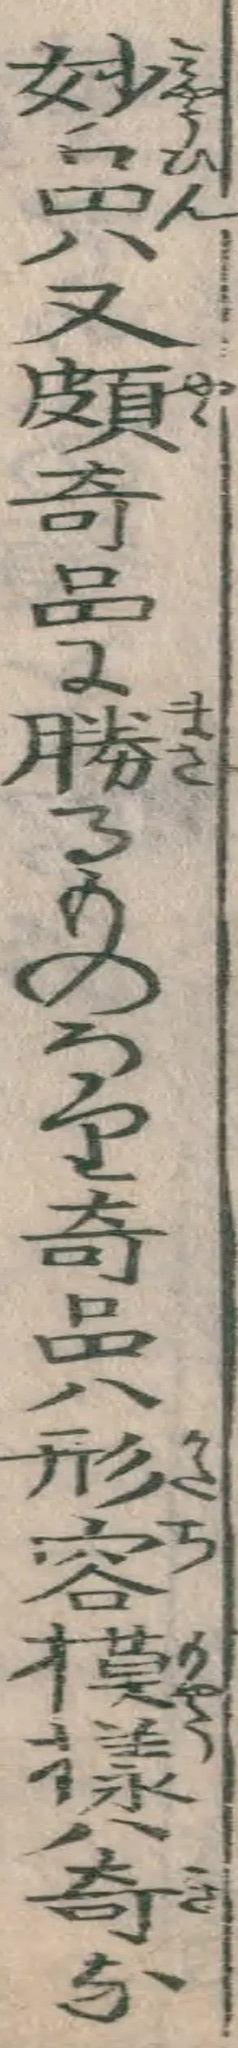一妙品は又頗奇品に勝るものなり奇品は形容模様は奇な
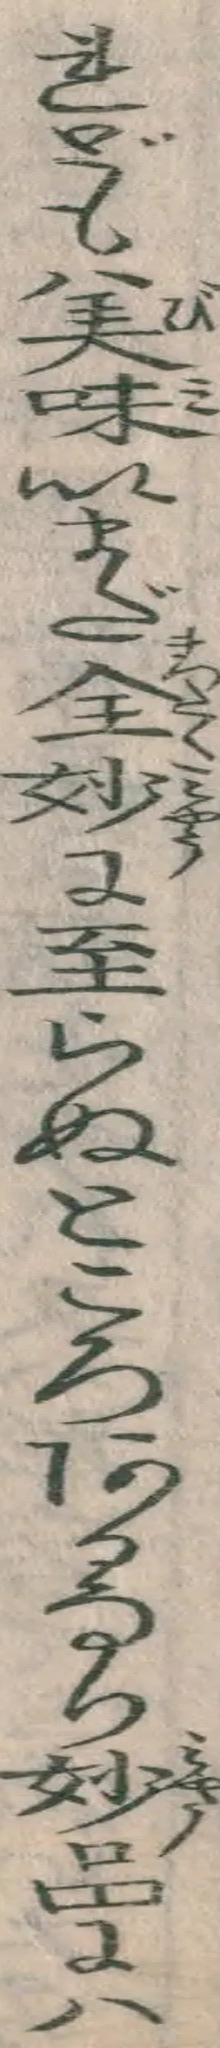れども美味いまだ全妙に至らぬところあるなり妙品には
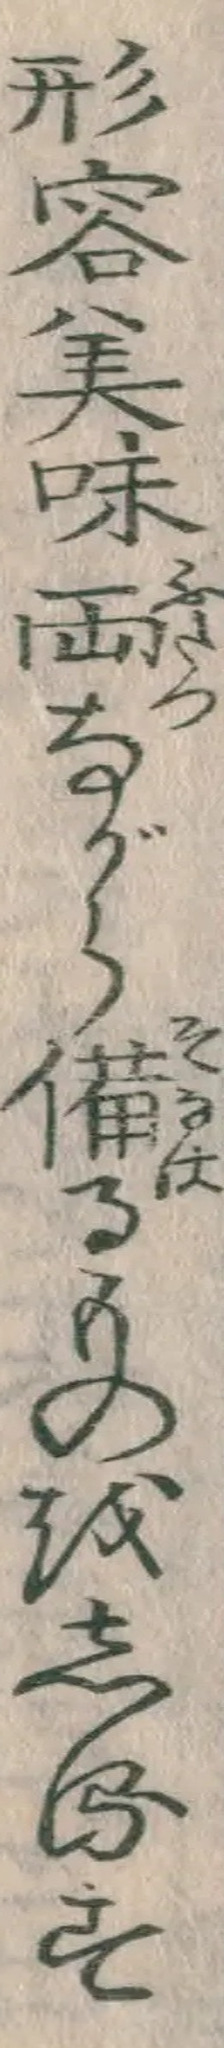形容美味両ながら備るものをしるす
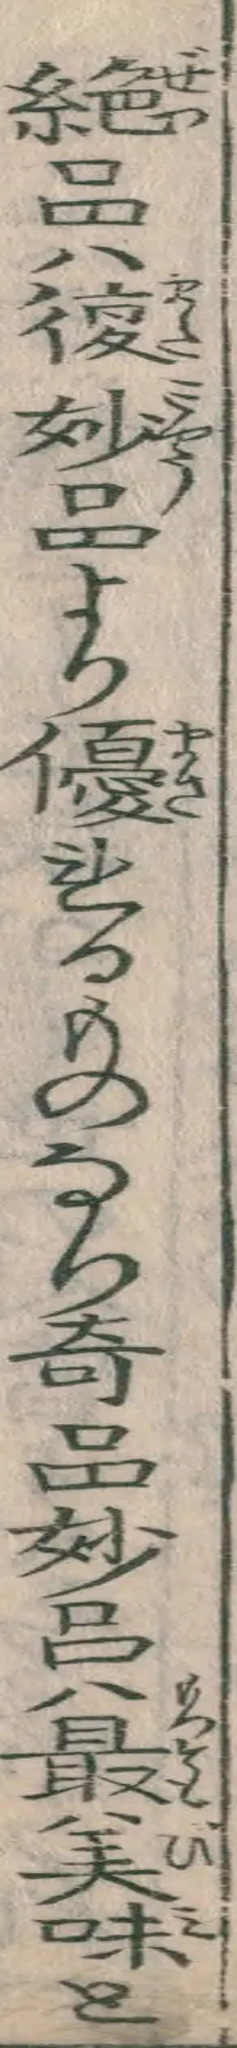一絶品は復妙品より優れるものなり奇品妙品は最美味と
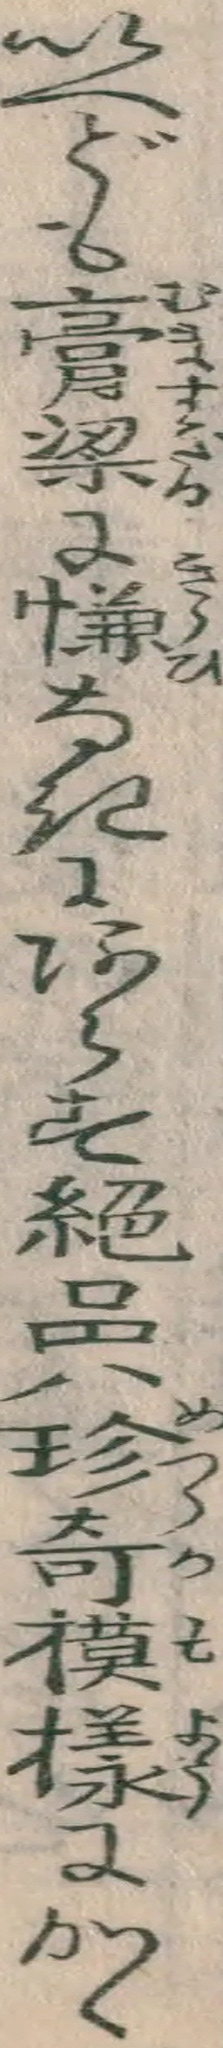いへども膏梁に慊なきにあらす絶品は珍奇模様にかゝ
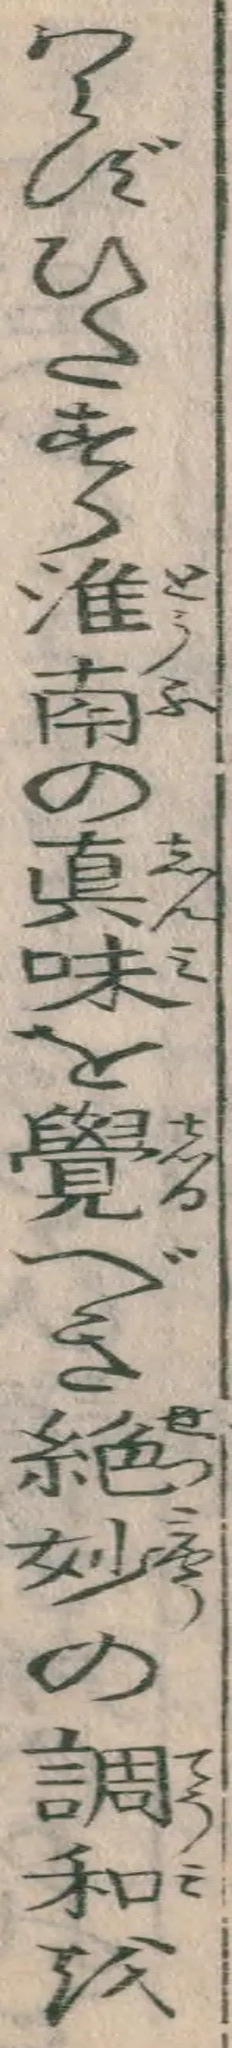はらずひたすら淮南の真味を覚べき絶妙の調和を
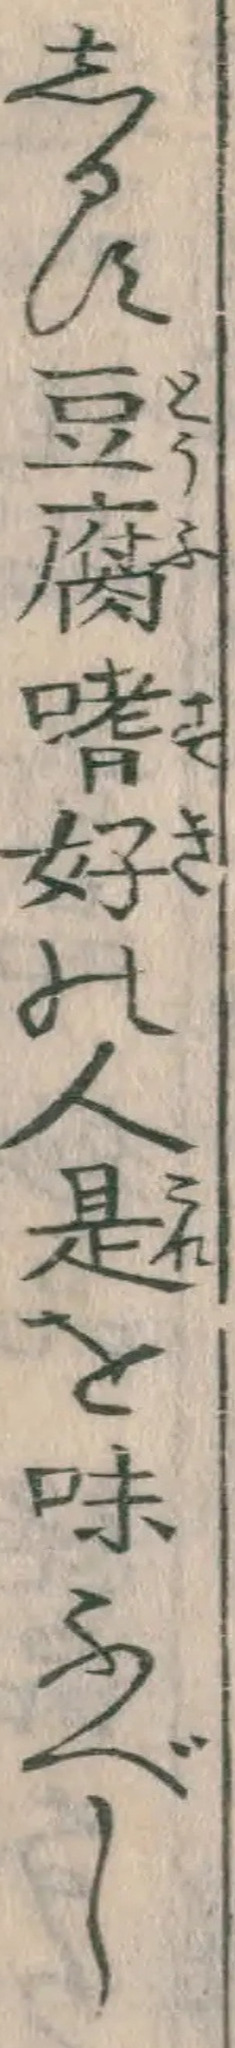しるす豆腐嗜好の人是を味ふべし
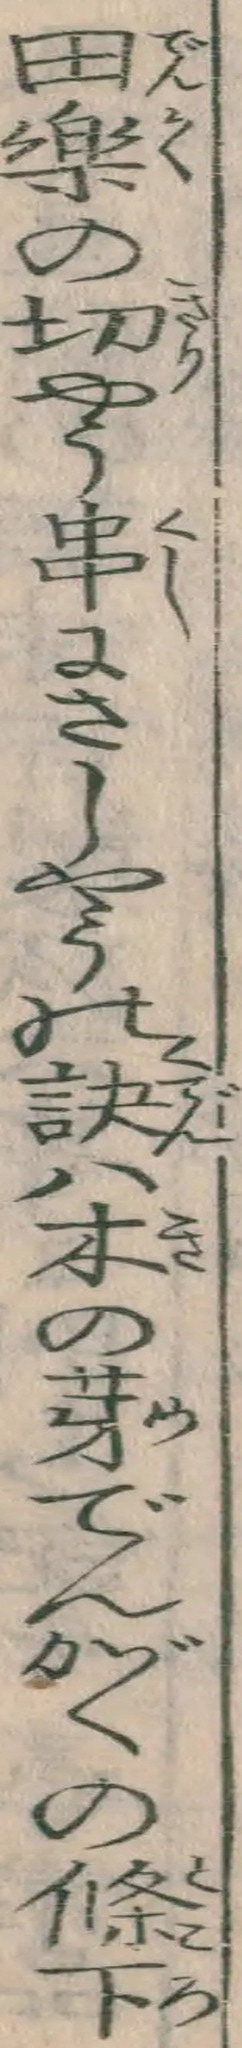一田楽の切やう串にさしやうの訣は木の芽でんがくの條下
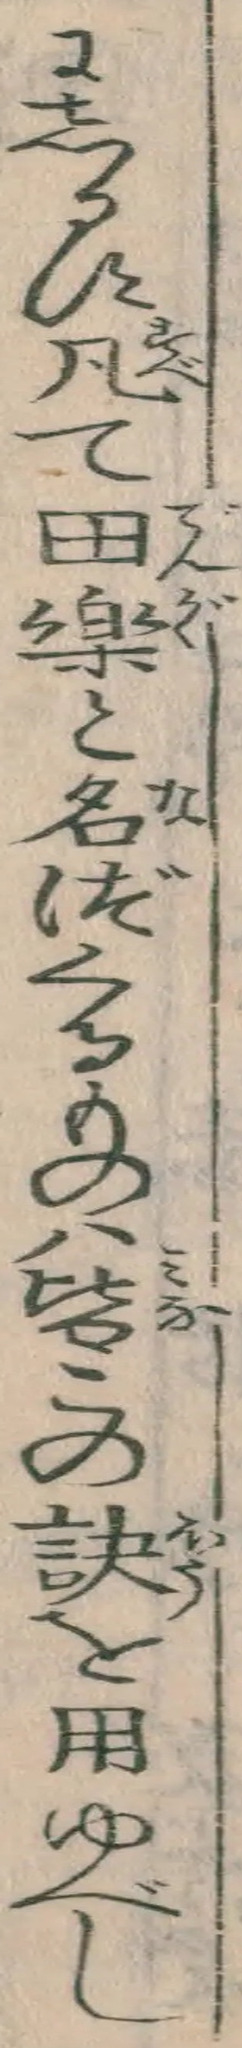にしるす凡て田楽と名づくるものは皆この訣を用ゆべし
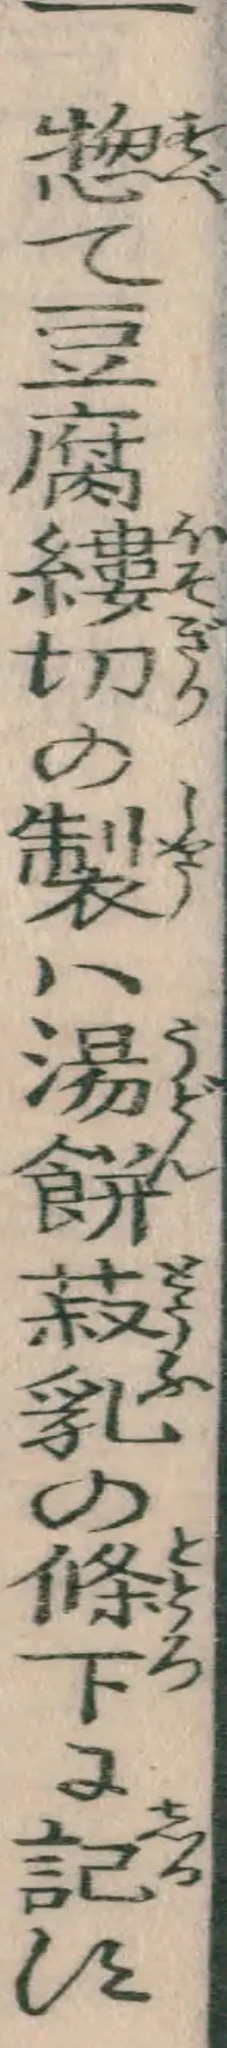一惣て豆腐縷切の製は湯餅菽乳の條下に記す
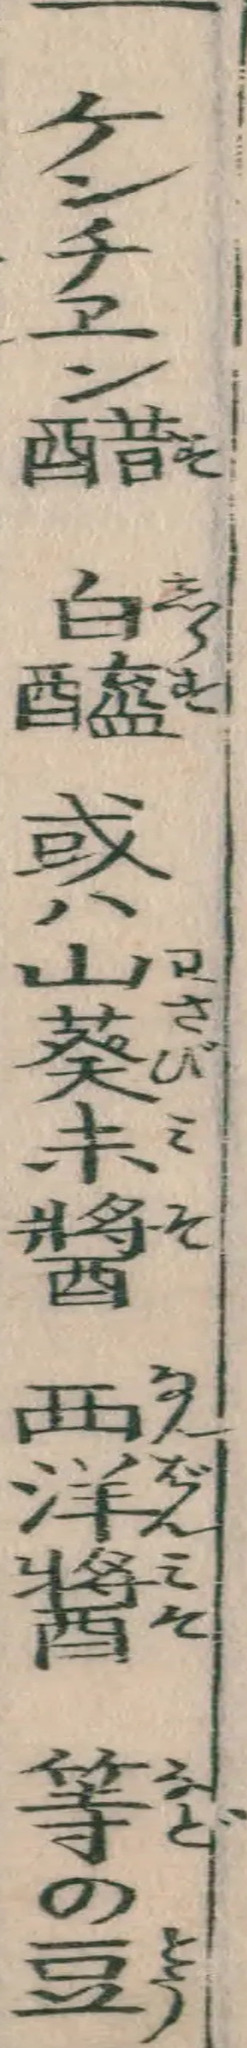一ケンチヱン醋白醯或は山葵未醤西洋醬等の豆
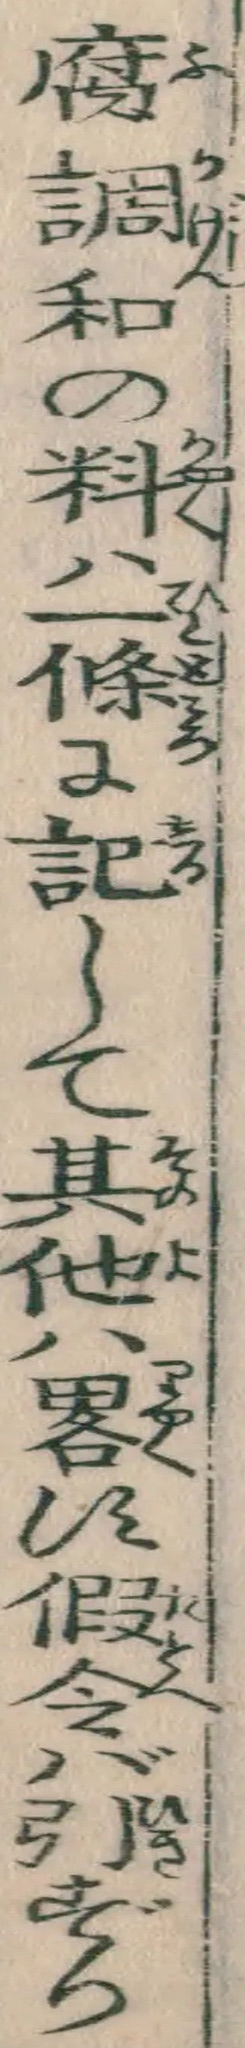腐調和の料は一條に記して其他は略す假令ば引ずり
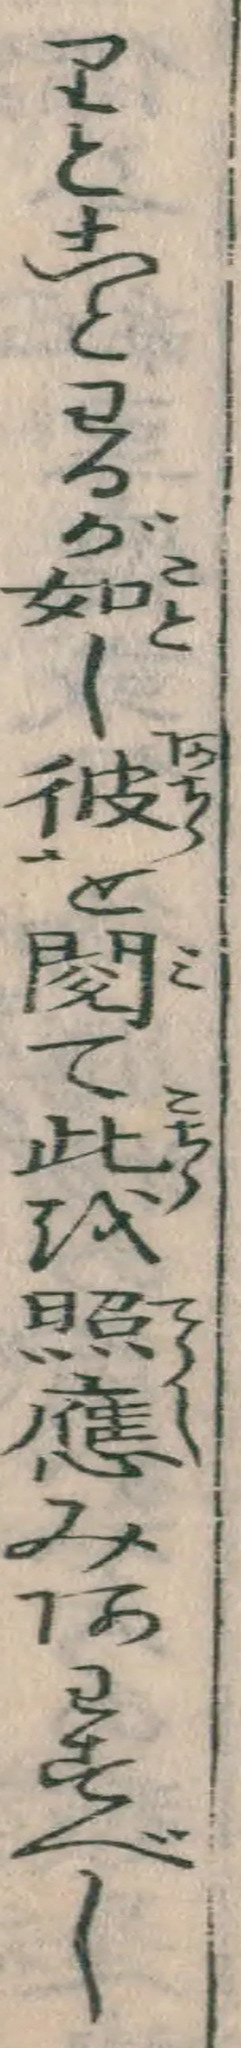りとことわるが如し彼を閲て此を照応みあわすべし
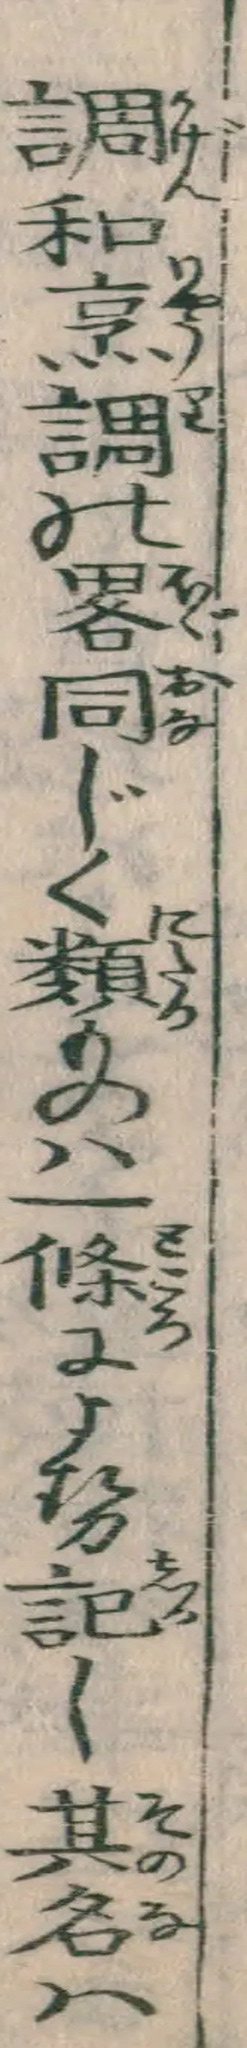一調和烹調の略同じく類ものは一條によせ記し其名は
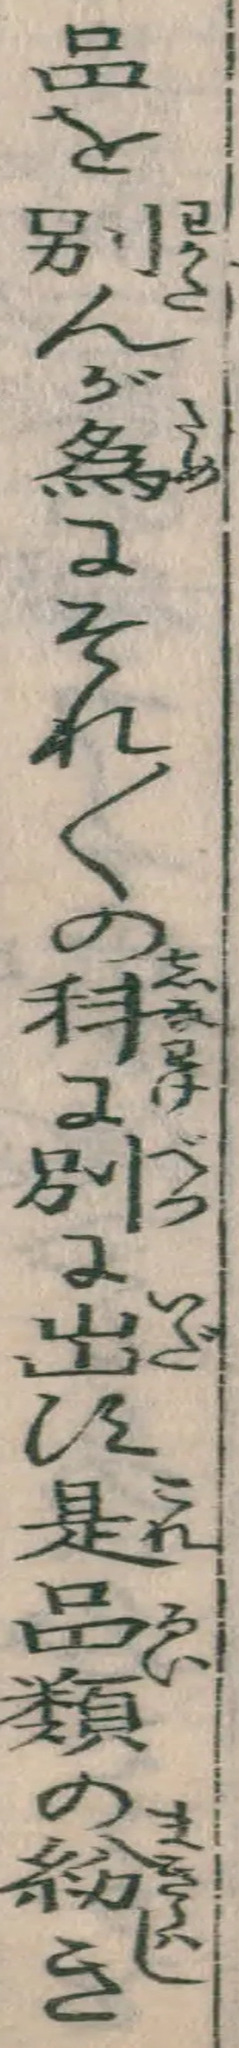品を別んが為にそれ〳〵の科に別に出す是品類の紛き
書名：豆腐百珍. [正編]
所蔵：国立国会図書館 National Diet Library, JAPAN
